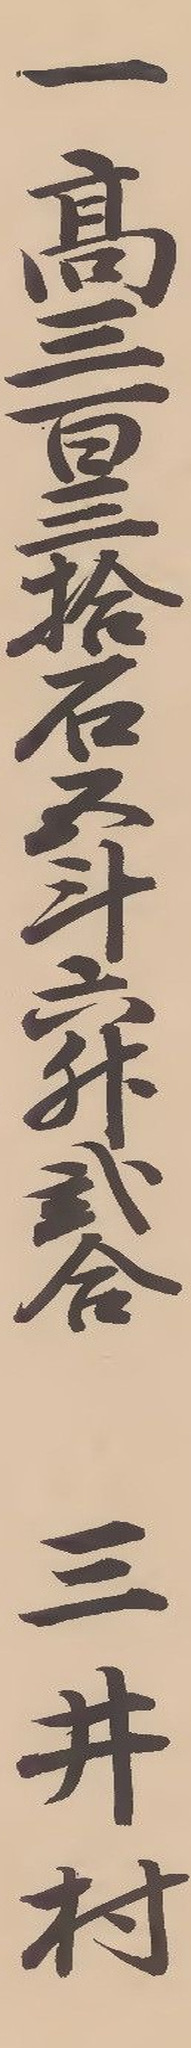一高三百三拾石五斗六升弐合三井村
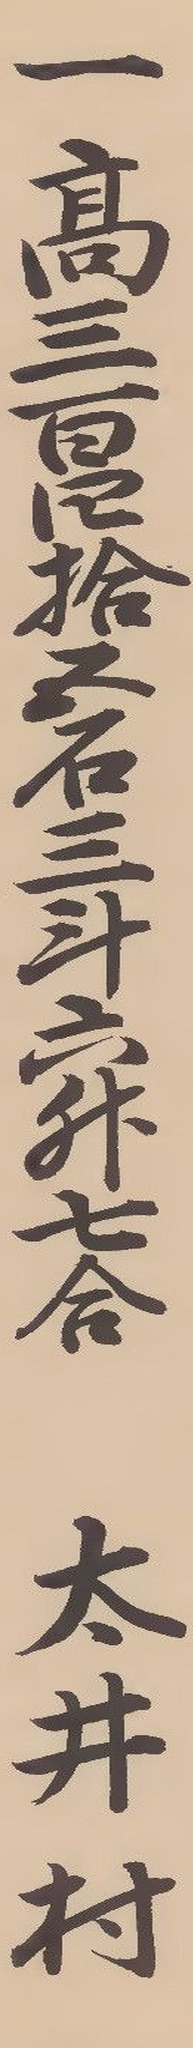一高三百四拾五石三斗六升七合太井村
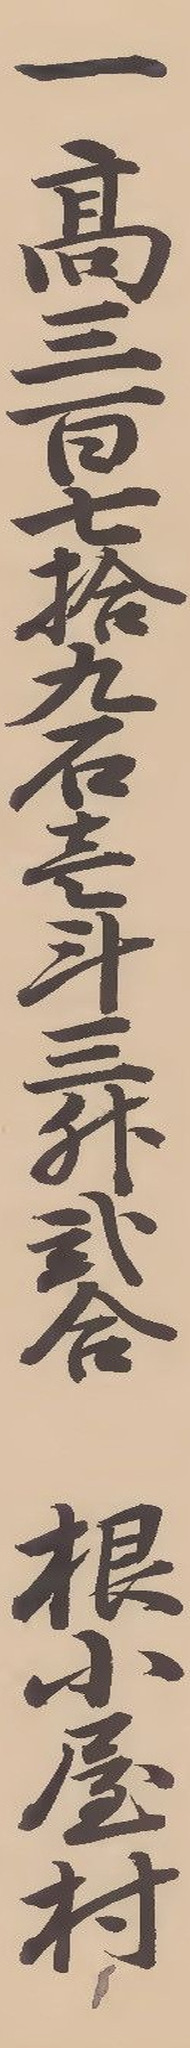一高三百七拾九石壱斗三升弐合根小屋村
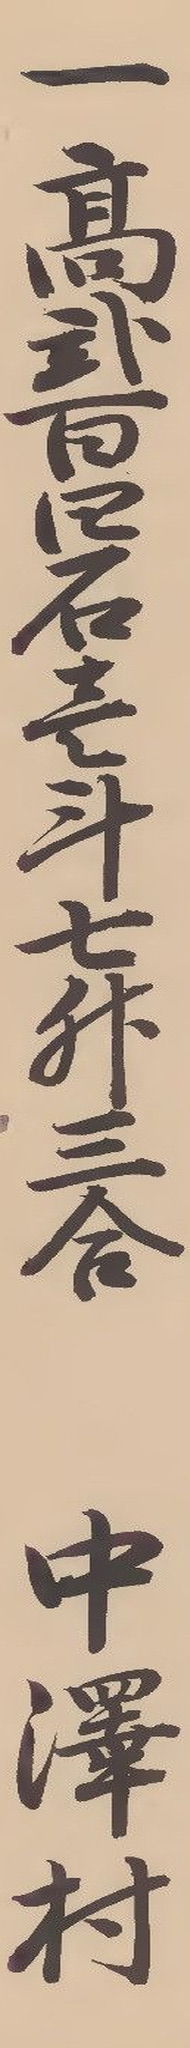一高弐百四石壱斗七升三合中澤村

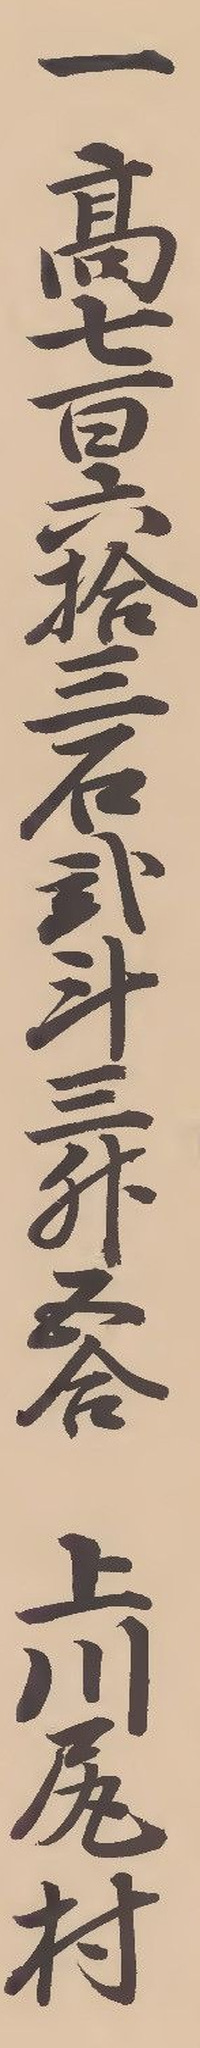一高七百六拾三石弐斗三升五合上川尻村
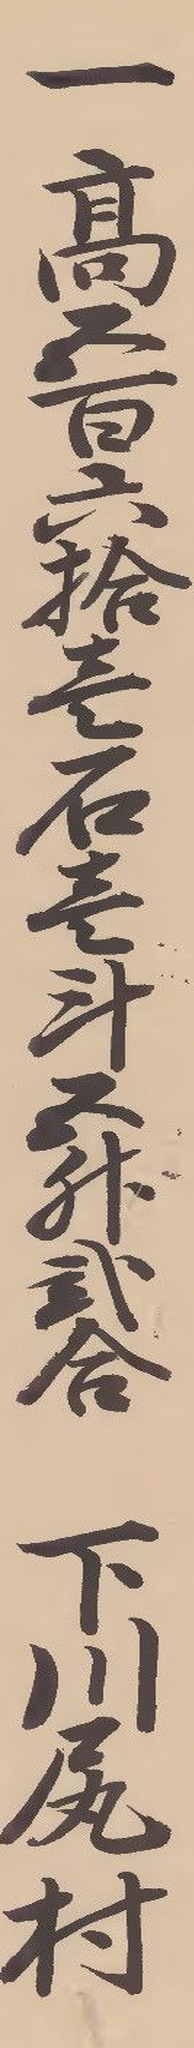一高五百六拾壱石壱斗五升弐合下川尻村
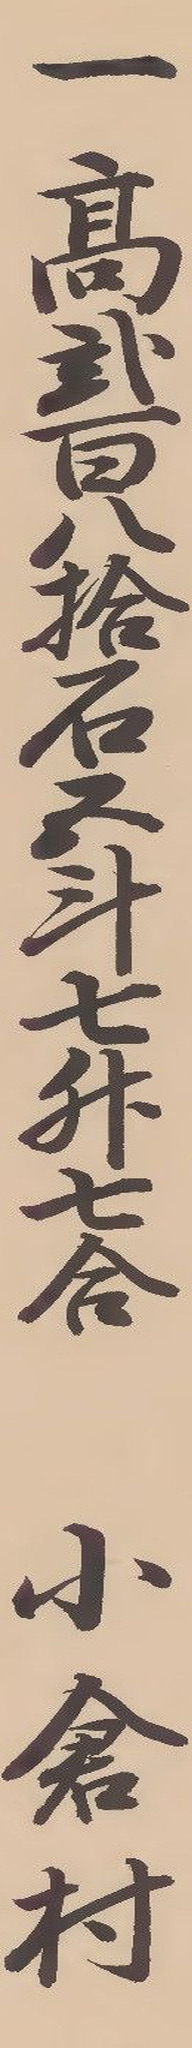一高弐百八拾石五斗七升七合小倉村
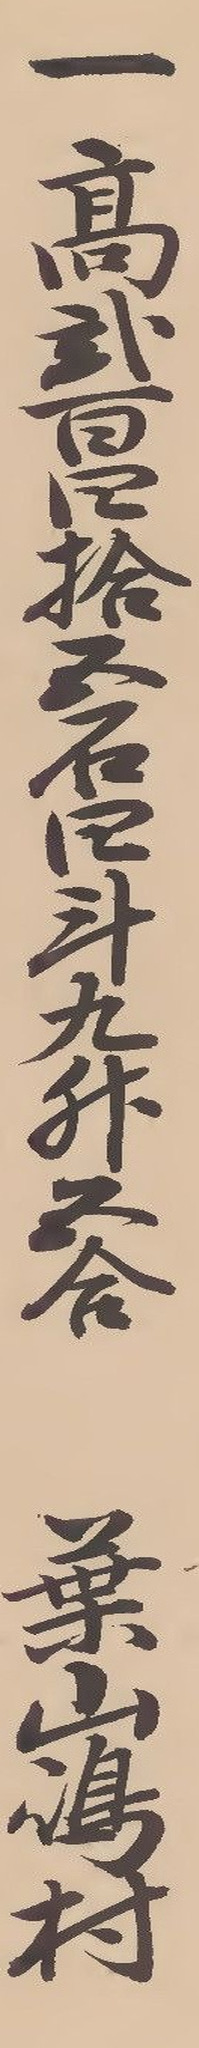一高弐百四拾五石四斗九升五合葉山嶋村
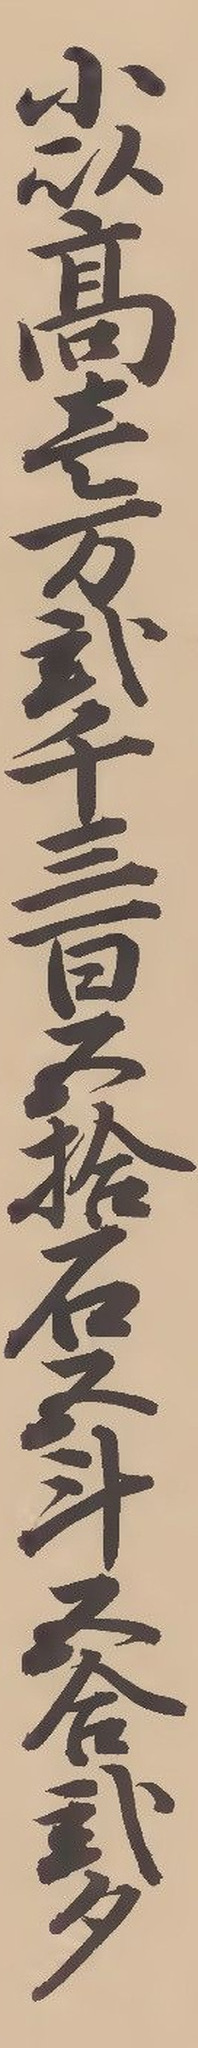小以高壱万弐千三百五拾石五斗五合弐勺
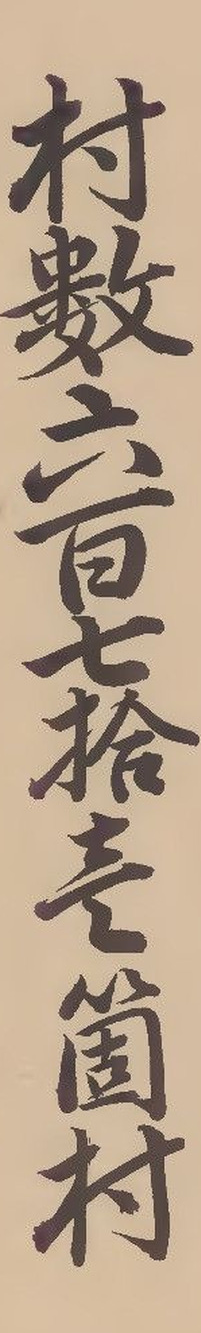村数六百七拾壱箇村

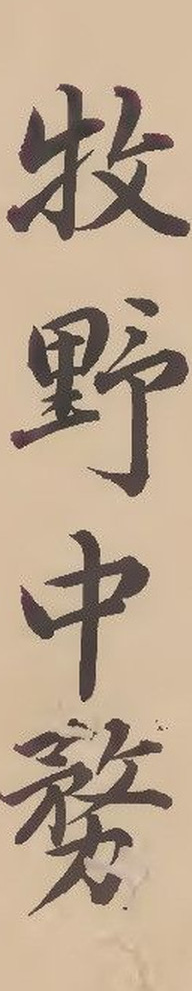牧野中務
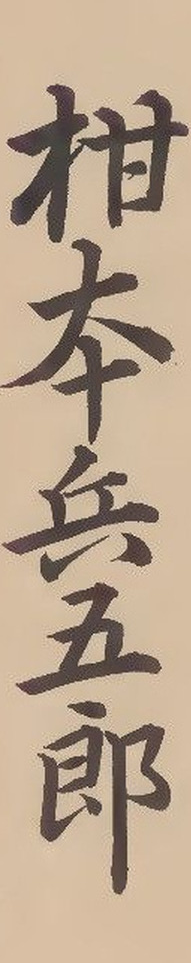柑本兵五郎
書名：相模国郷帳
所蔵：国立公文書館 National Archives of Japan
